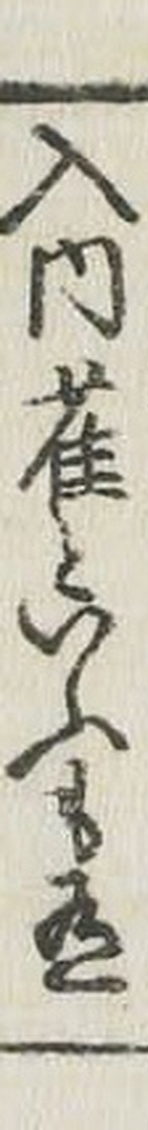入内雀といふも有
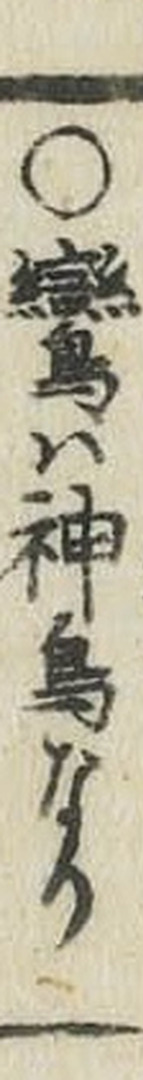○鸞は神鳥なり
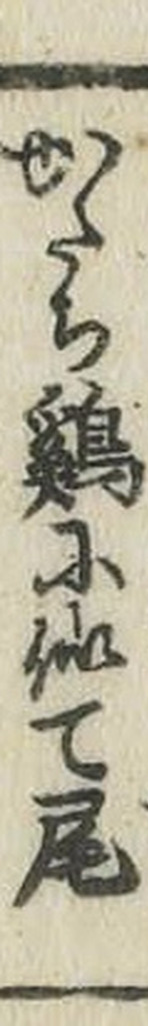かたち鶏に似て尾
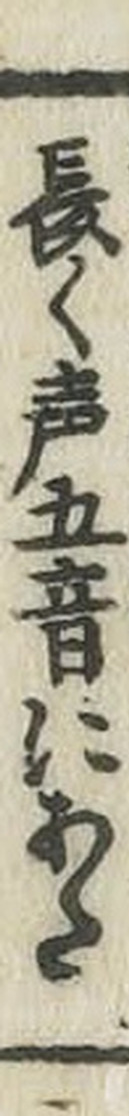長く声五音にあた
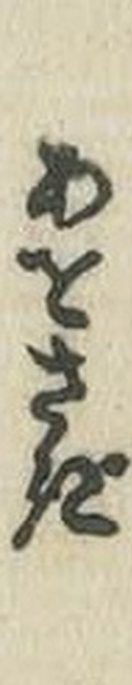あをさぎ
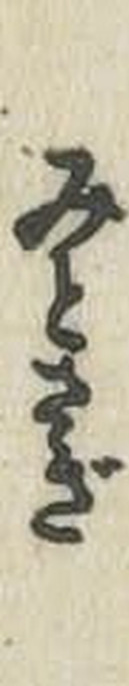みとさぎ
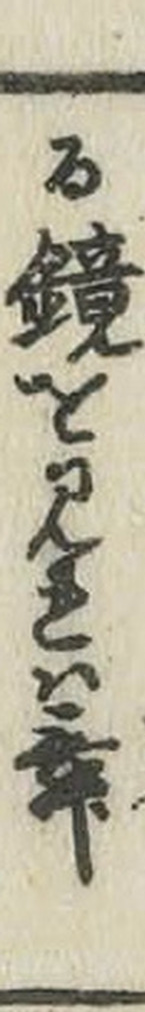る鏡を見れは舞
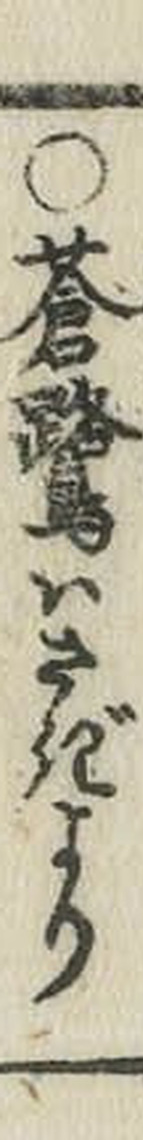○蒼鷺はさぎより
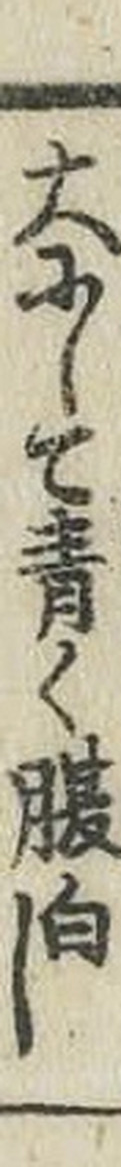大にして青く腹白し
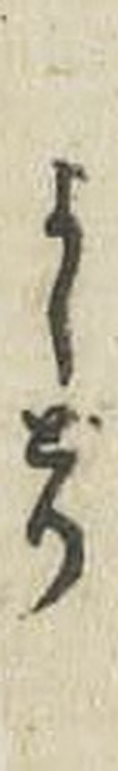よしとり
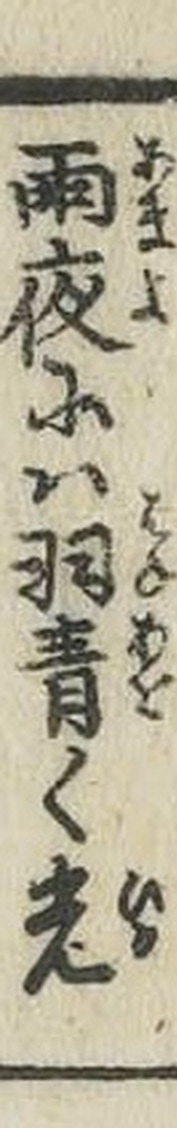雨夜には羽青く光
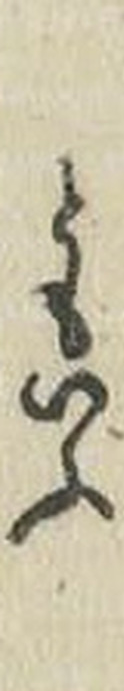ともいふ
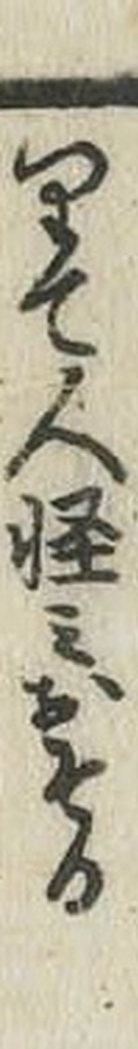りて人怪みおそる
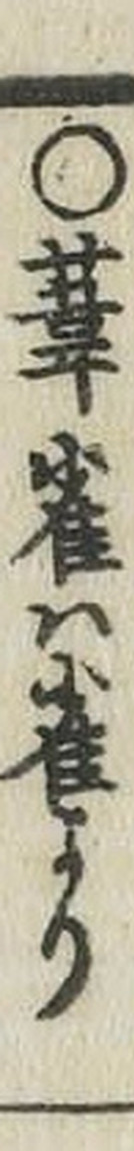○葦雀は雀より
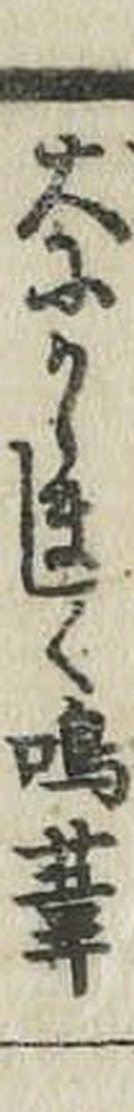大にかしましく鳴葦
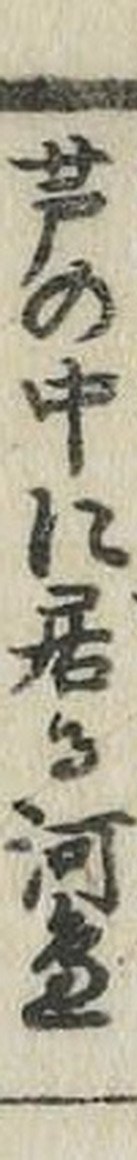芦の中に居る河辺
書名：増補頭書訓蒙図彙大成 10巻 6:巻之12-13
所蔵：東京学芸大学教育コンテンツアーカイブ
